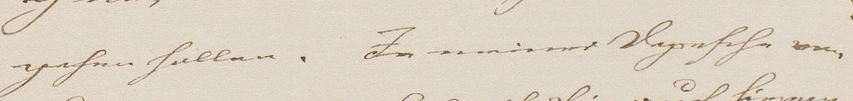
gehen sollen. In meiner Depesche von
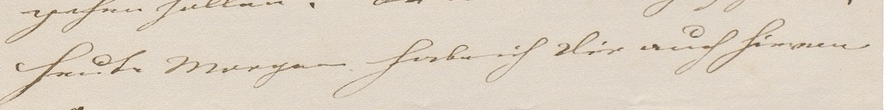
heute Morgen habe ich Dir auch hievon
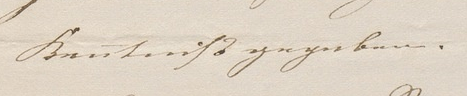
Kenntniß gegeben.
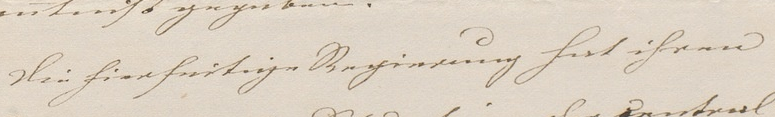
Die hierseitige Regierung hat ihren
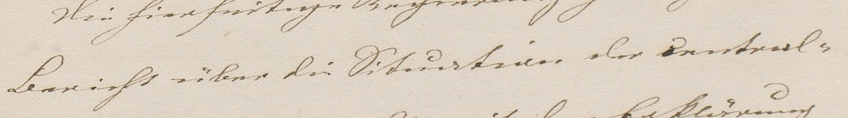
Bericht über die Situation der central-
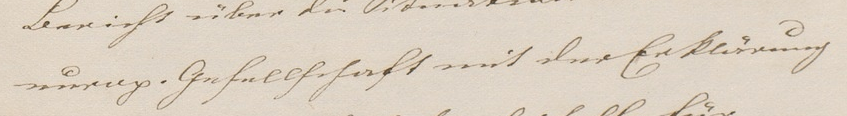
europ. Gesellschaft mit der Erklärung
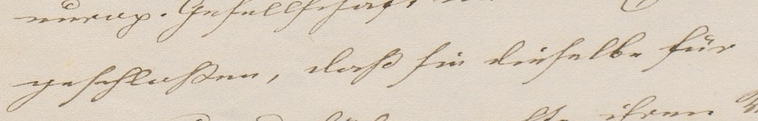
geschloßen, doch für dieselbe für
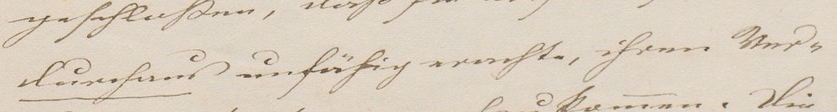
durchaus unfähig erachte, ihren Ver-
